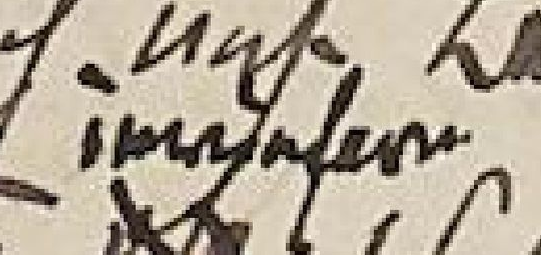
inweifern
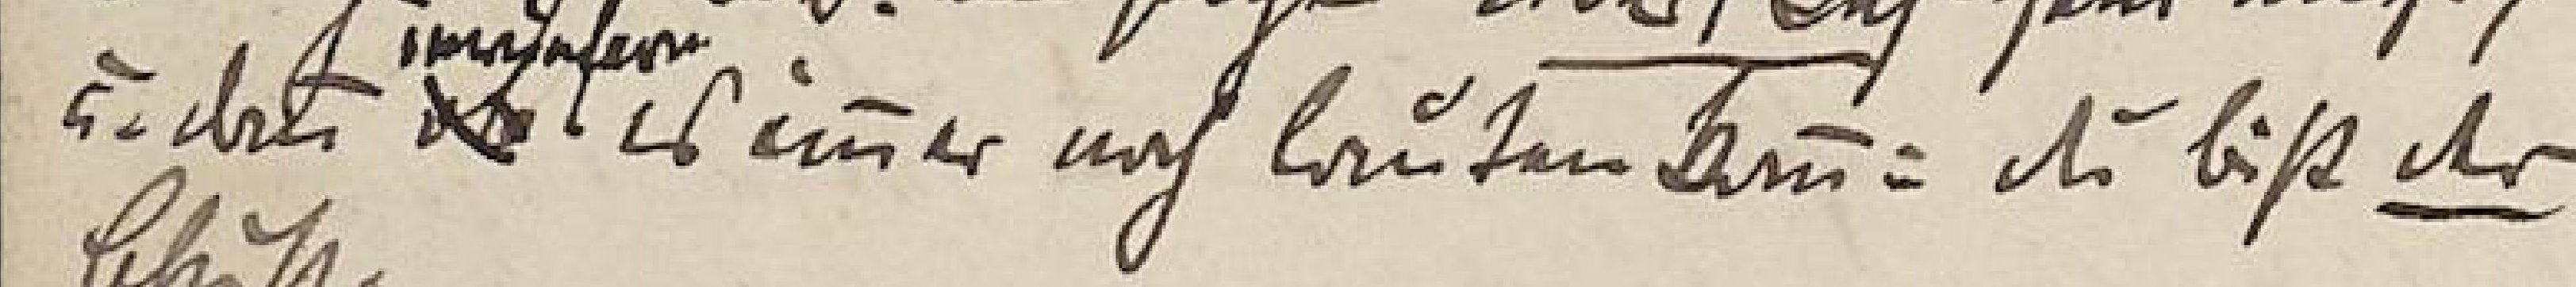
u. dan es imer noch lauten kan: du bist der
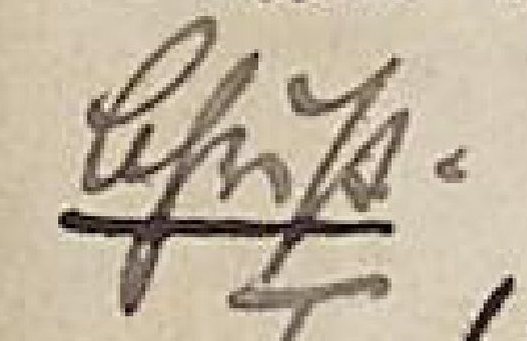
Christ.
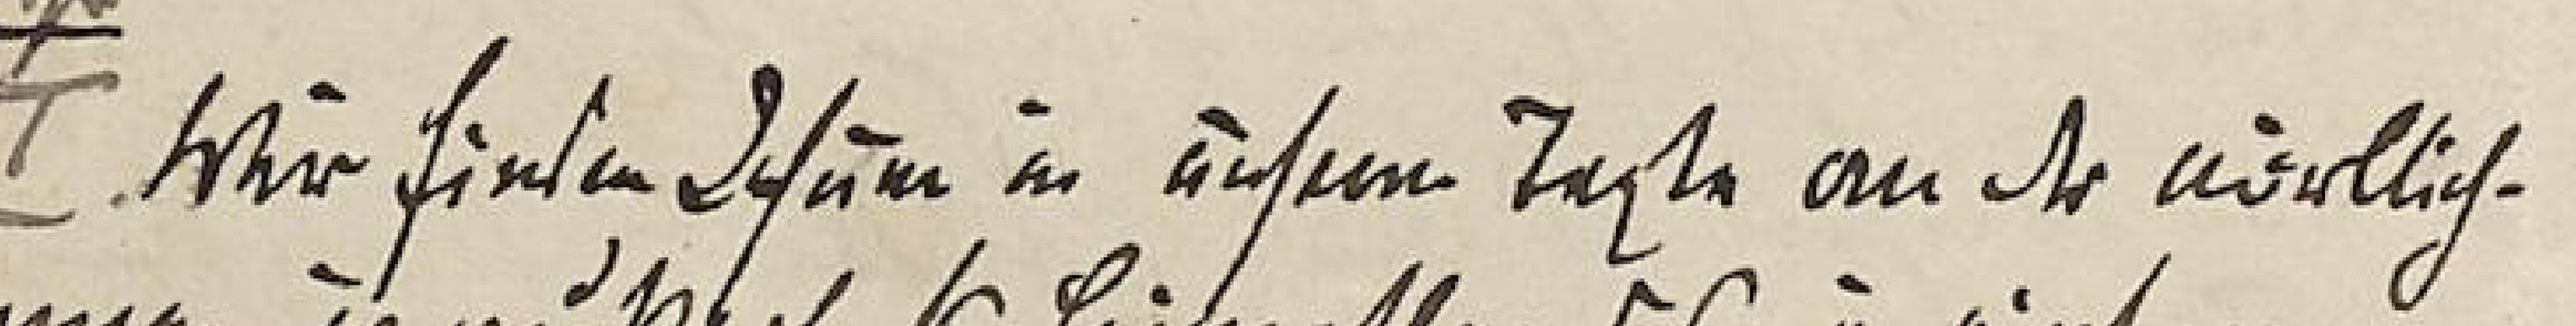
I. Wir finden Jesu in unserm Texte an der nördlich.
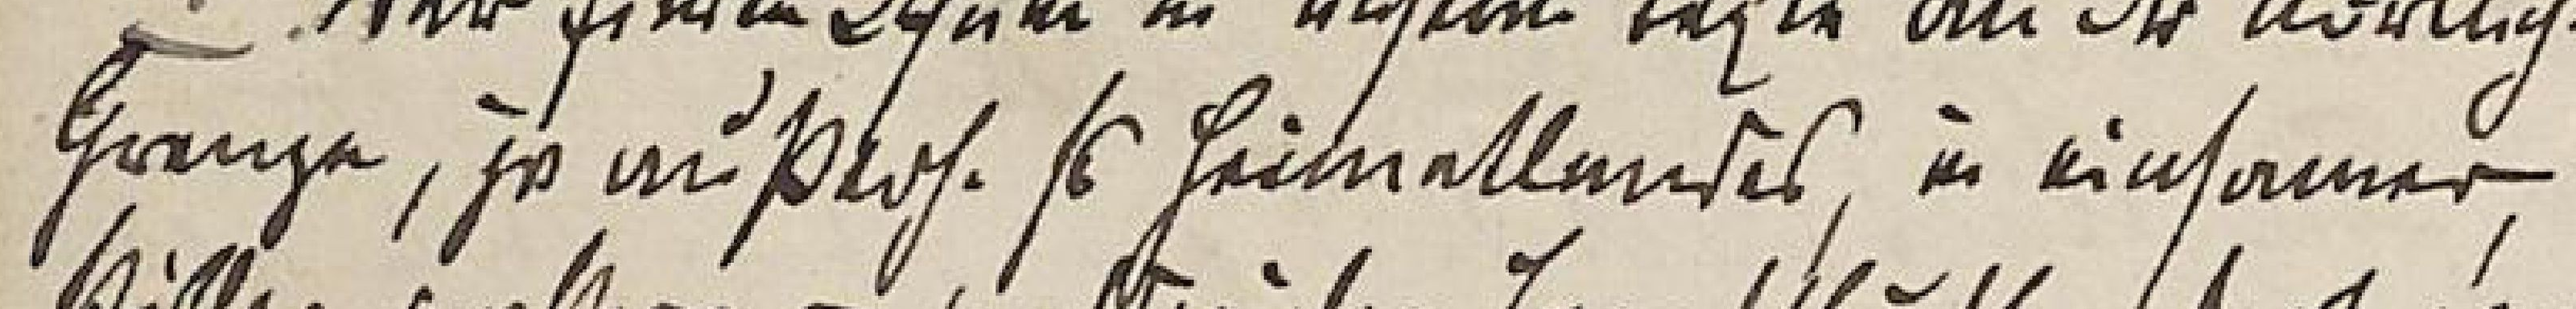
Grenze, ja außerh. ss Heimatlandes, in einsamer,
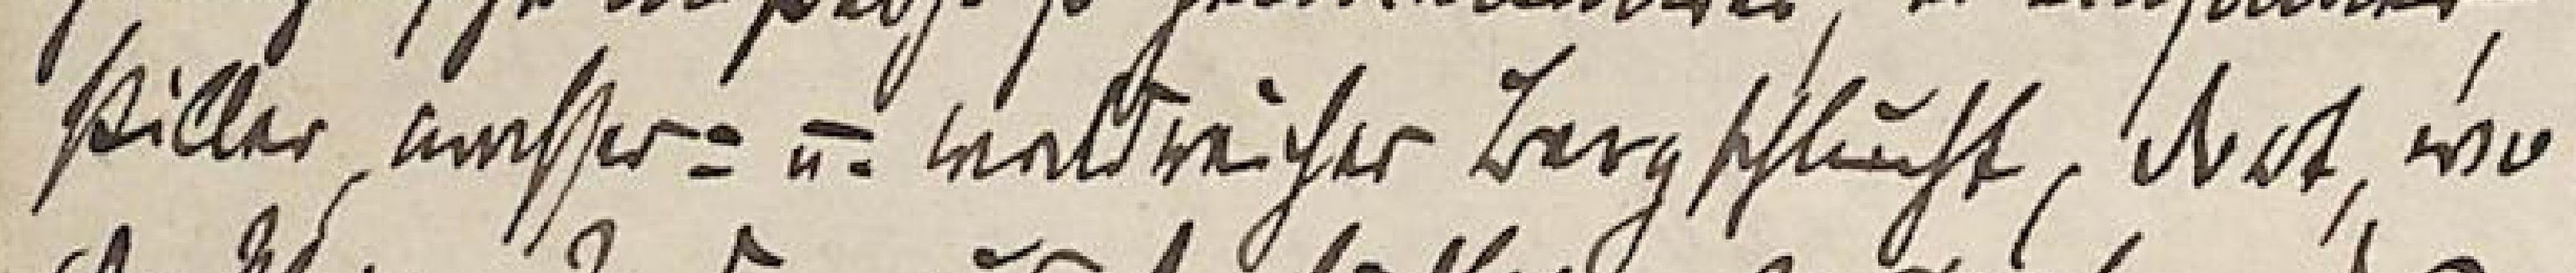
stiller, wasser- und waldreicher Bergschlucht, dort, wo
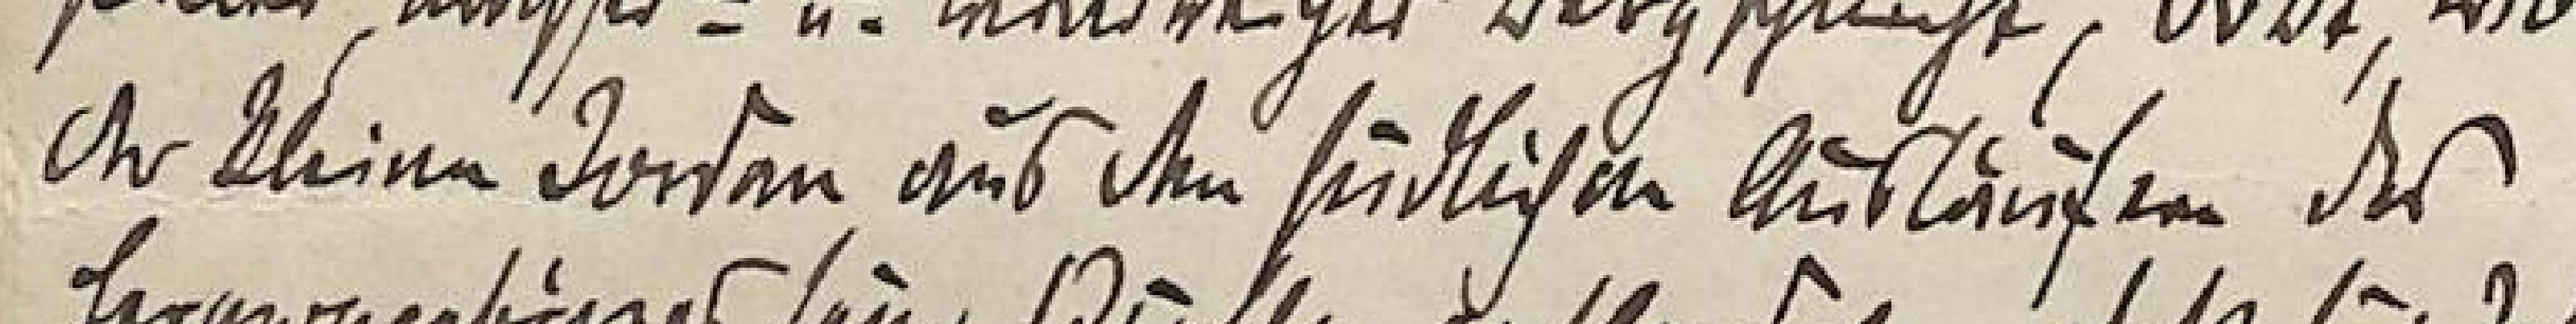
der kleine Jordan aus dem südlichen Auslaufes des
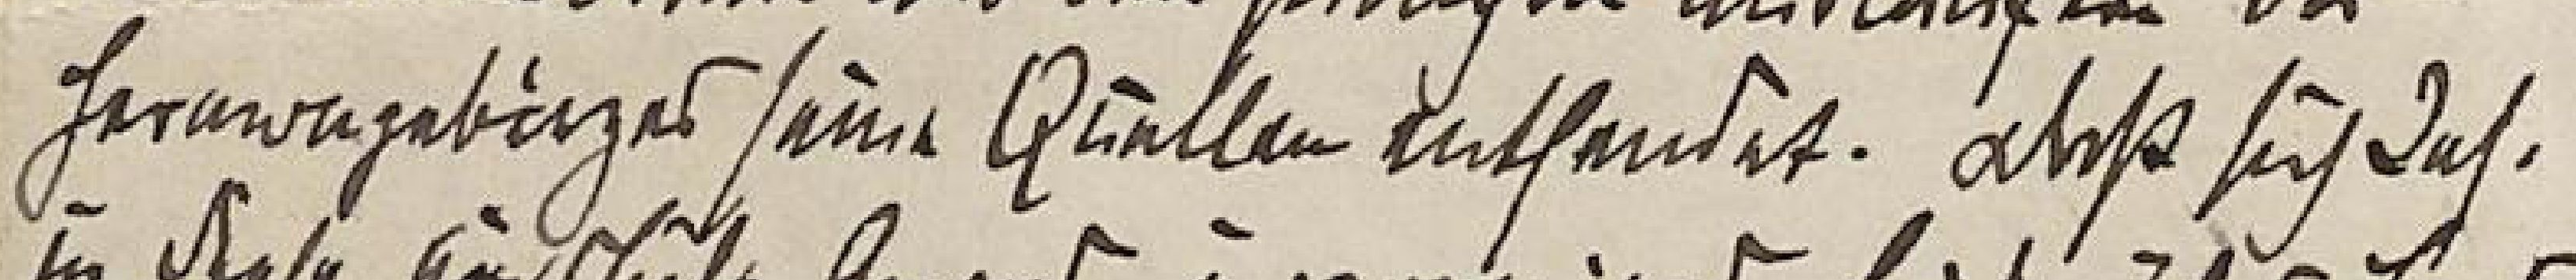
Hermongebirges seine Quellen entsendet. Daß sich Jes.
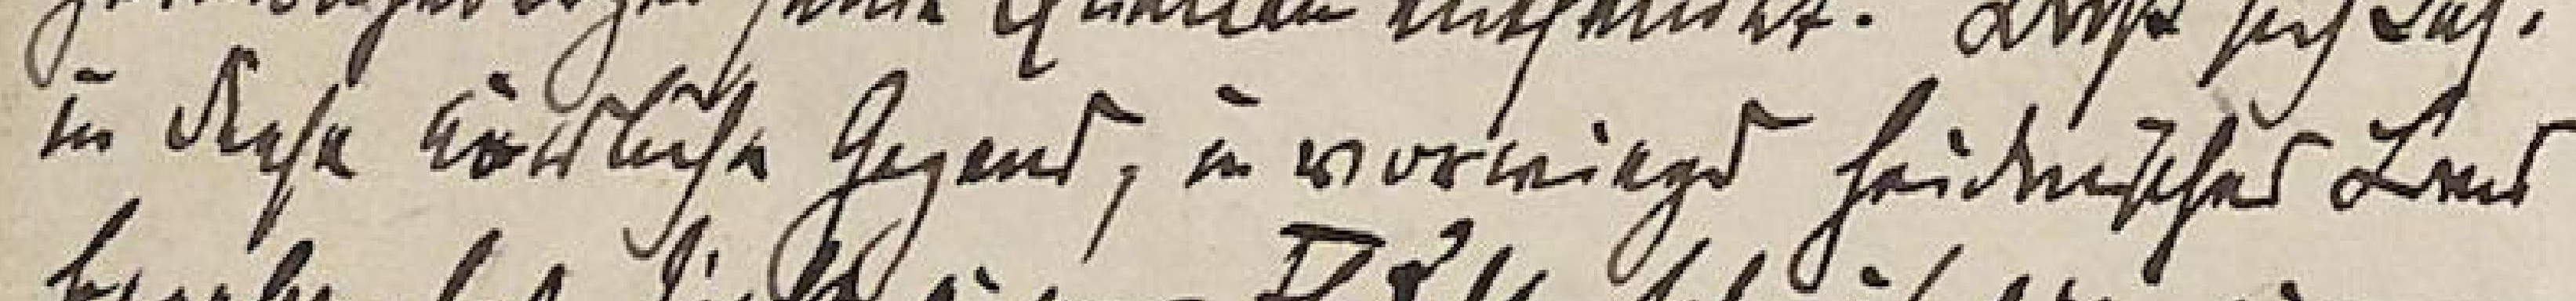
in diese nördliche Gegend, in vorwiegd heidnisches Land
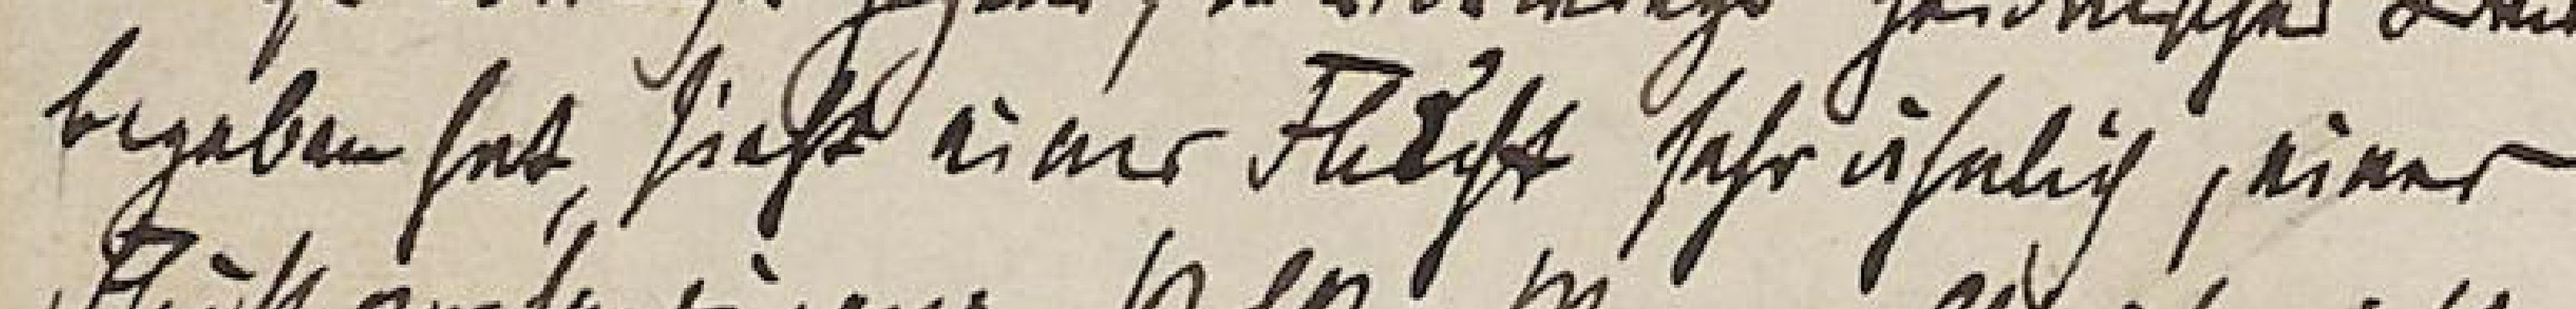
begeben hat, sieht einer Flucht sehr ähnlich, einer
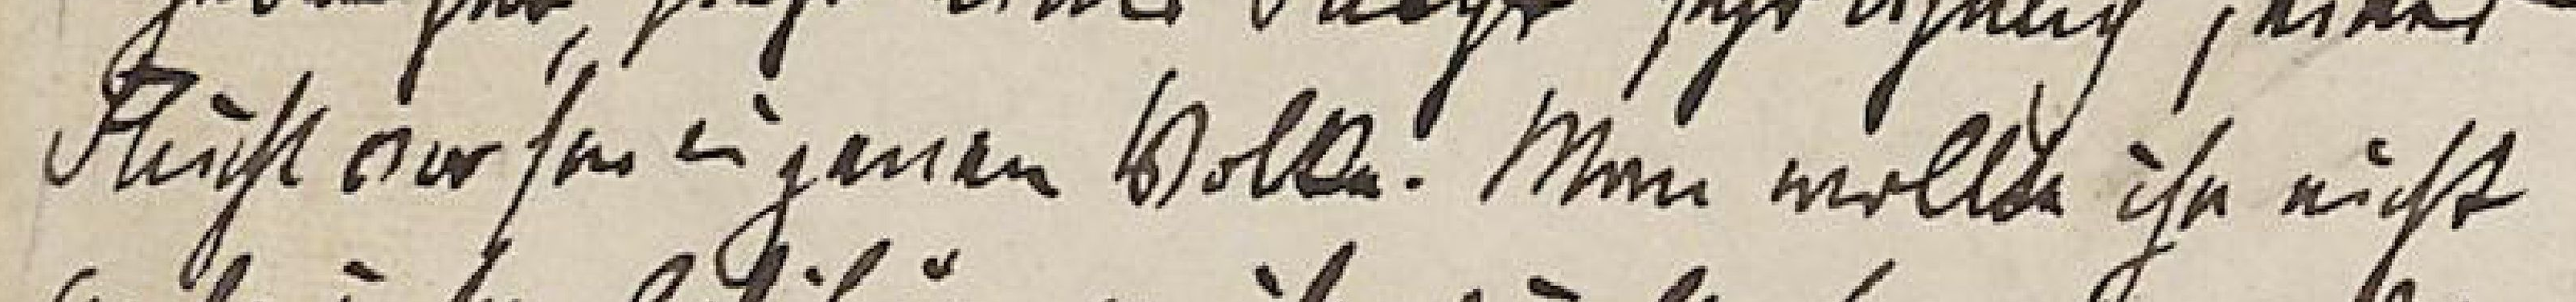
Fluch vor sm eigenen Volke. Man wollte ihn nicht
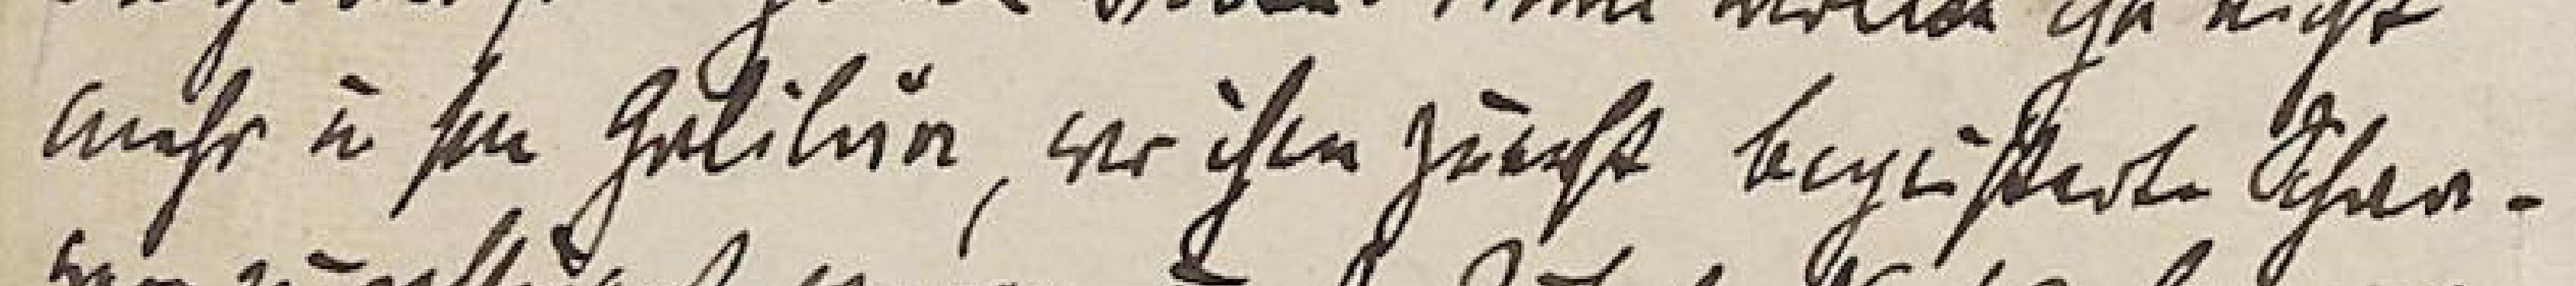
mehr in sm Galiläa, wo ihm zuerst begeisterte Schaa¬
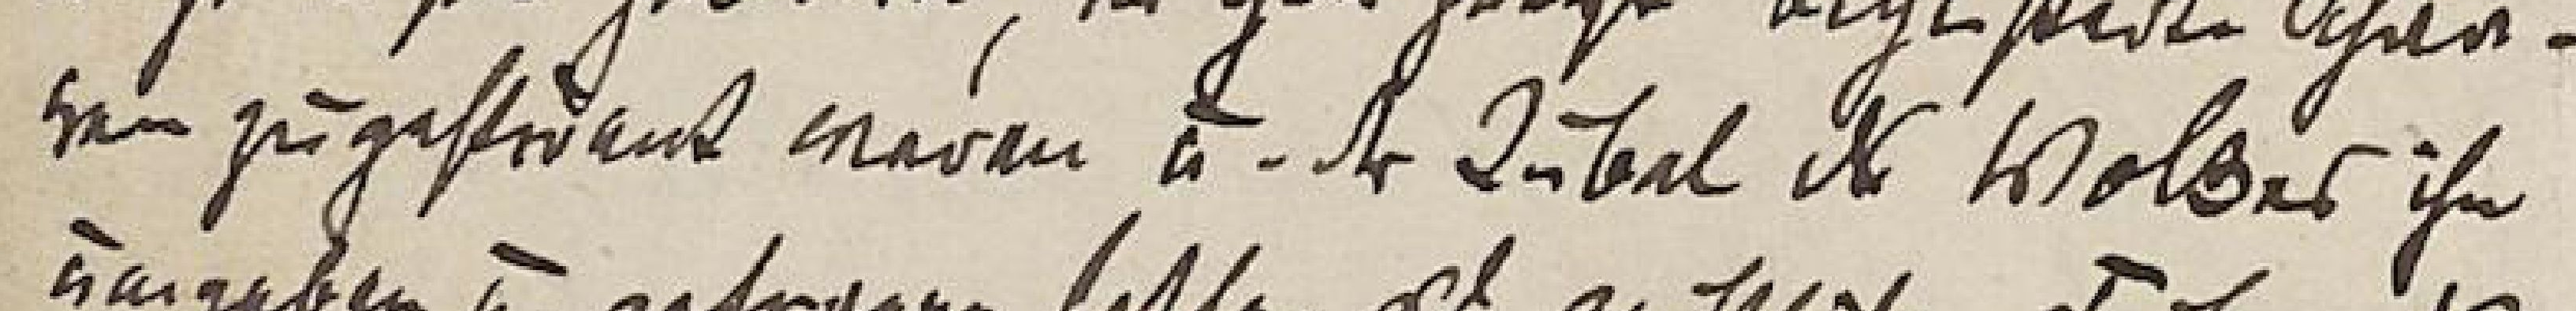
ren zugeströmt waren u. dr Jubel ds Volkes ihn
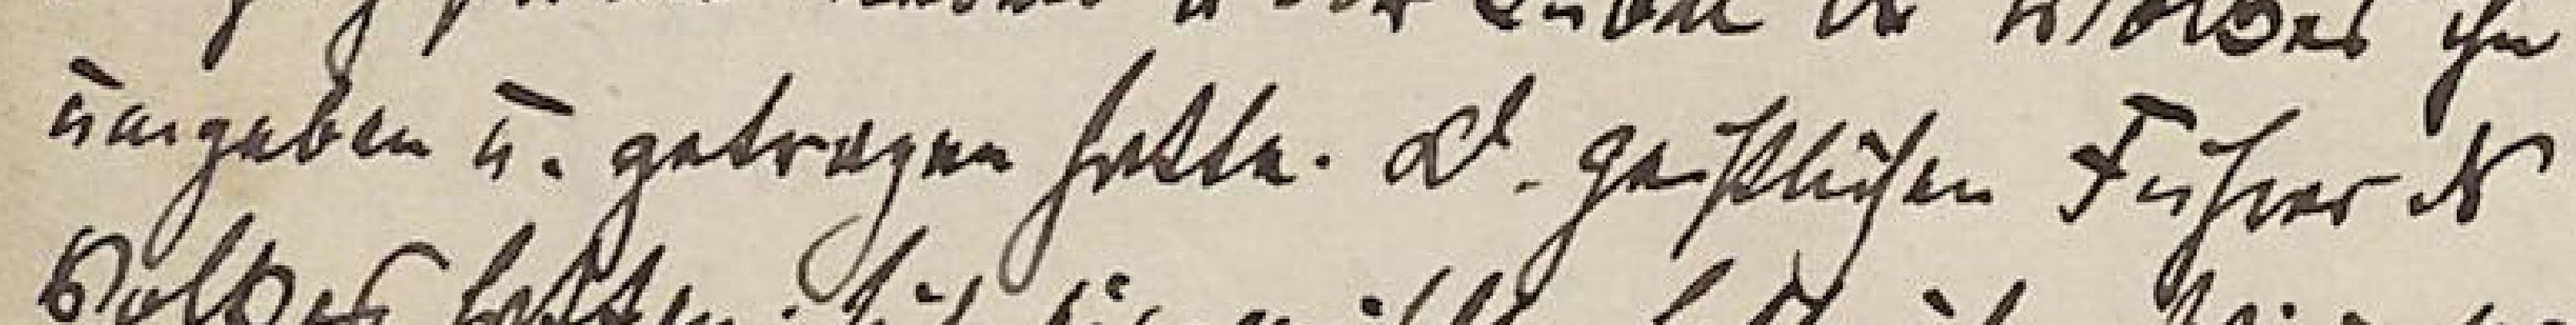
umgeben u. getragen hatte. D. geistlichen Führer ds
